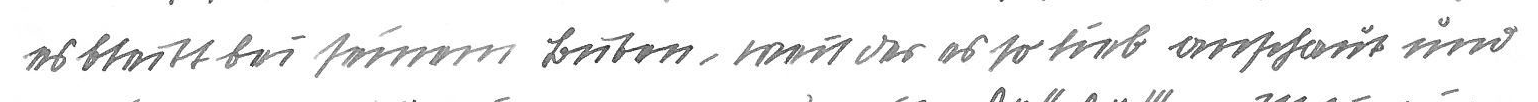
es bleibt bei seinem Buben, weil der es so lieb anschaut und
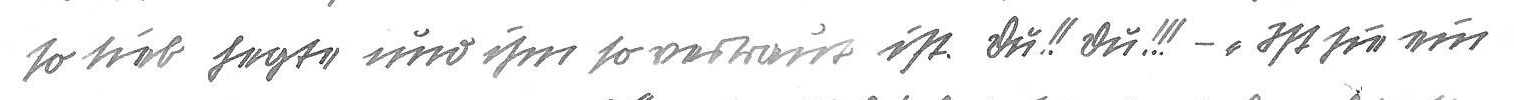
so lieb hegte und ihm so vertraut ist. Du!! Du!!! – „Ist sie ein
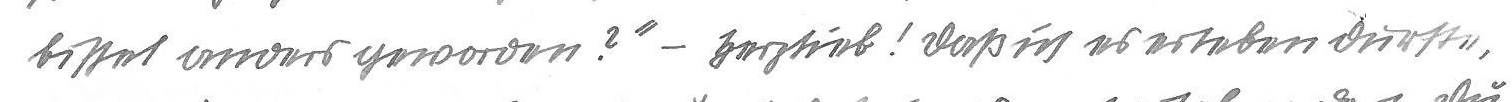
bissel anders geworden?” – Herzlieb! Daß ich es erleben durfte,
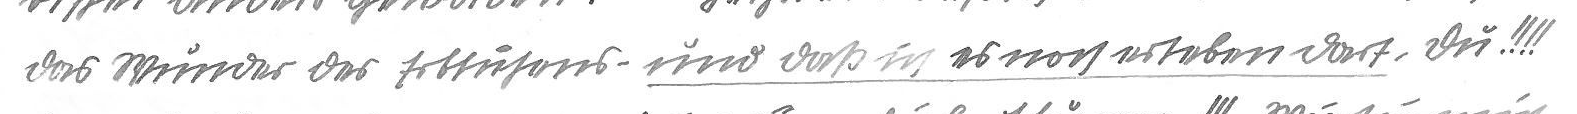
das Wunder des Erblühens – und daß ich es noch erleben darf, Du!!!!
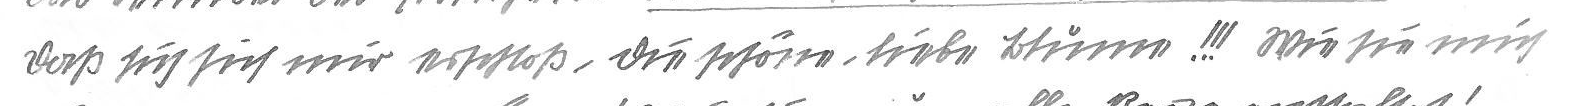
Daß sich sich mir erschloß, die schöne, liebe Blume!!! Wie sie mich
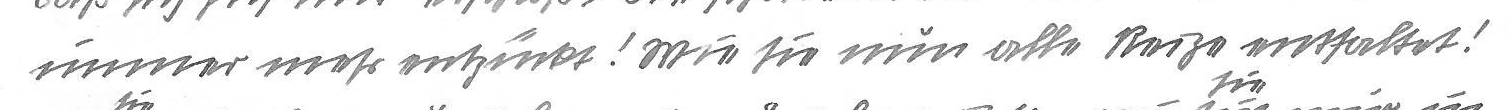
immer mehr entzückt! Wie sie mir alle Reize entfaltet!
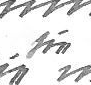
sie
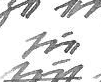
sie
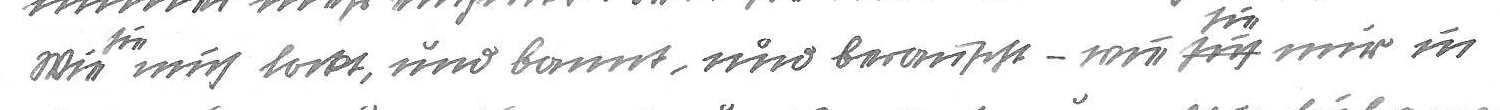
Wie mich lockt, und bannt, und berauscht – wie sich mir in
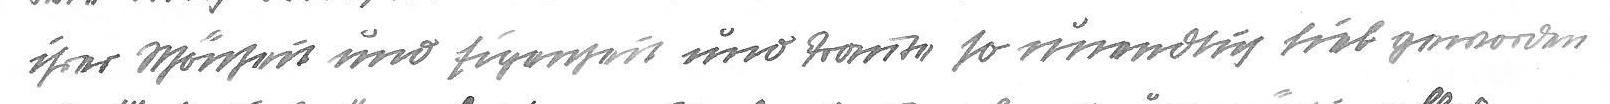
ihrer Schönheit und Eigenheit und Traute so unendlich lieb geworden
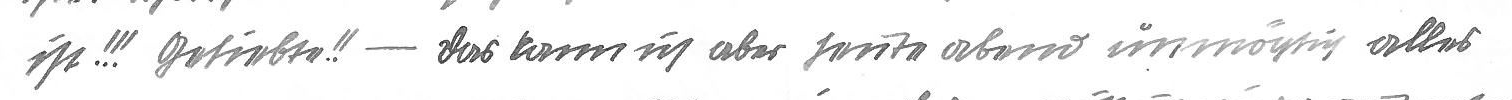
ist!!! Geliebte!! – Das kann ich aber heute abend unmöglich alles
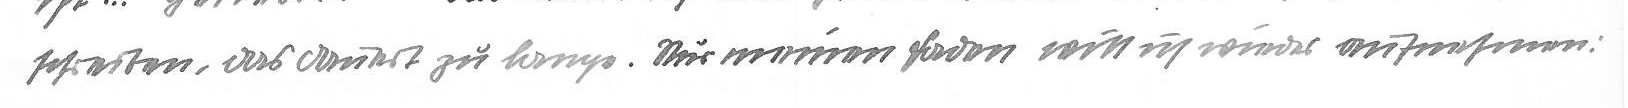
schreiben, das dauert zu lange. Nur meinen Faden will ich wieder aufnehmen:
